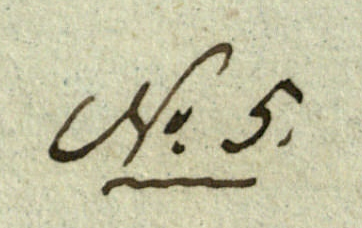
Nº 5.
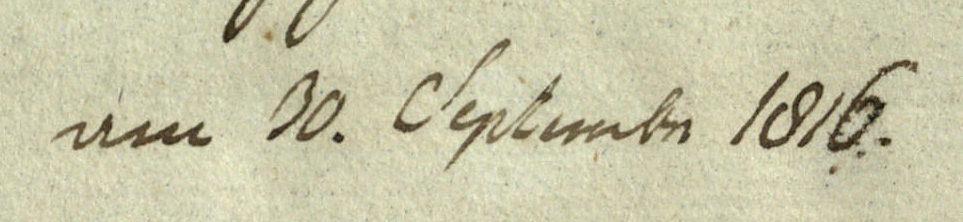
am 30. Septembr. 1816.
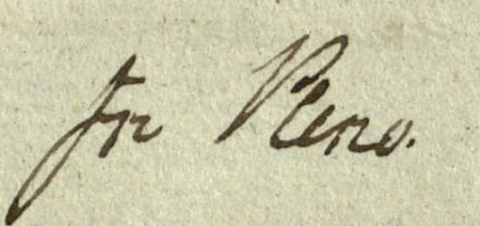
In Pleno.
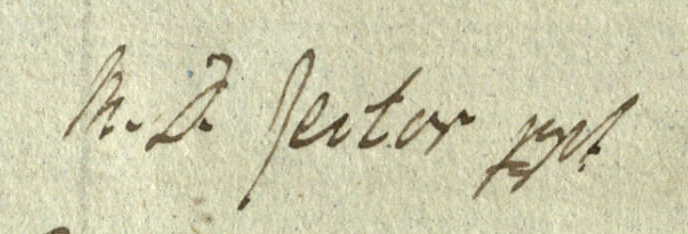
M. D. Rector ppt.
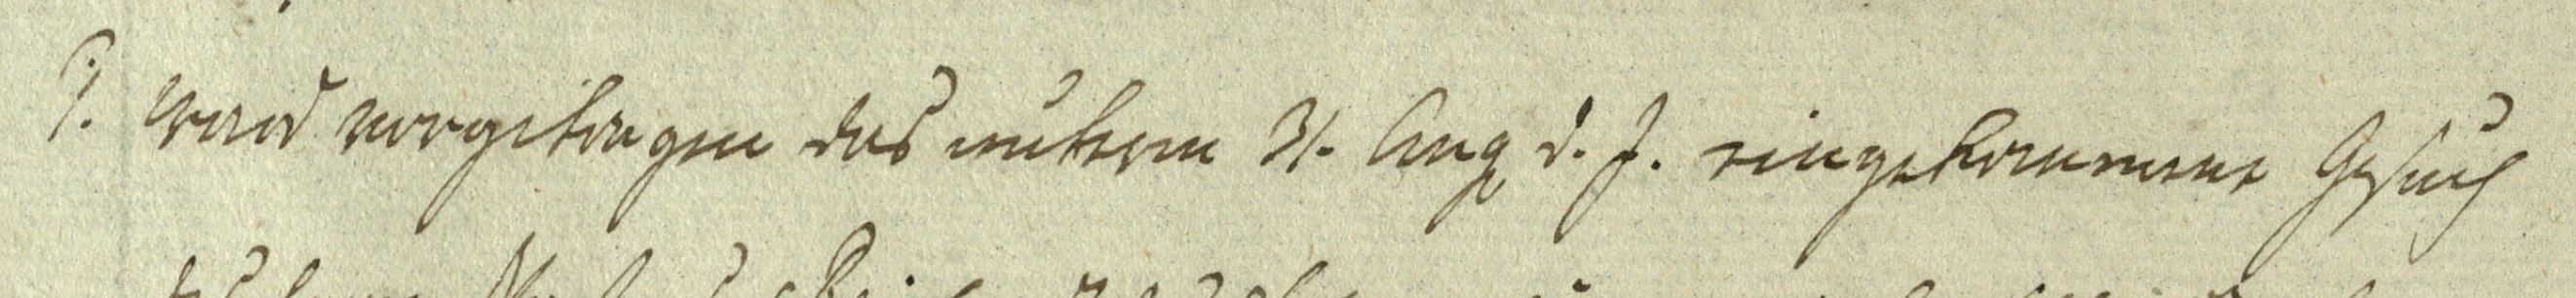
1. Ward vorgetragen das unterm 31. Aug d. J. eingekommene Gesuch
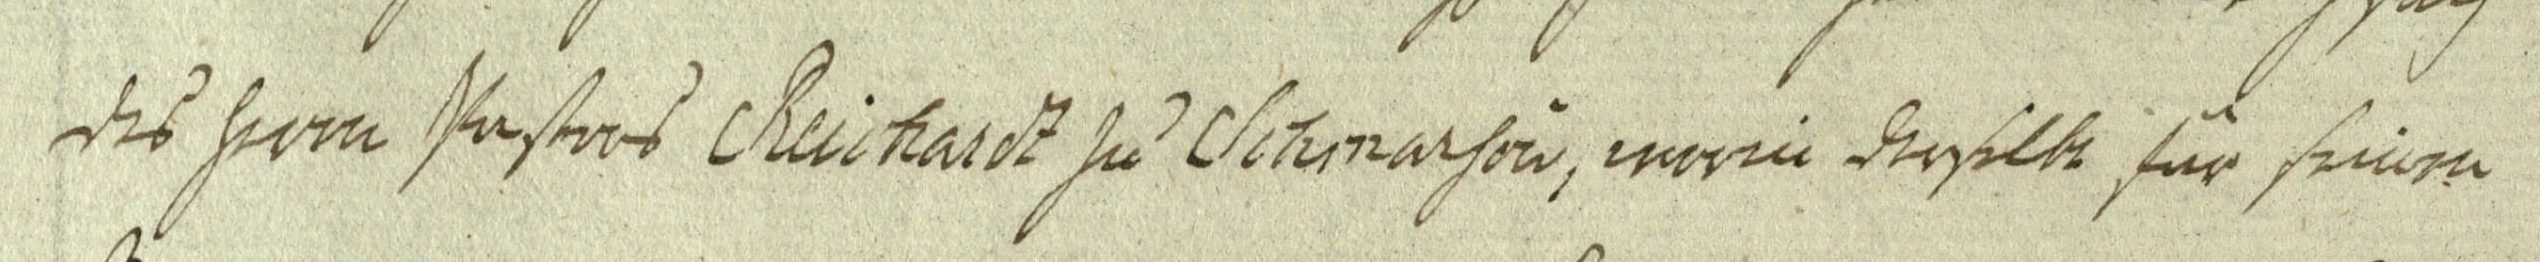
des Herrn Pastors Reichardt zu Schmarsow, worin derselbe für seinen
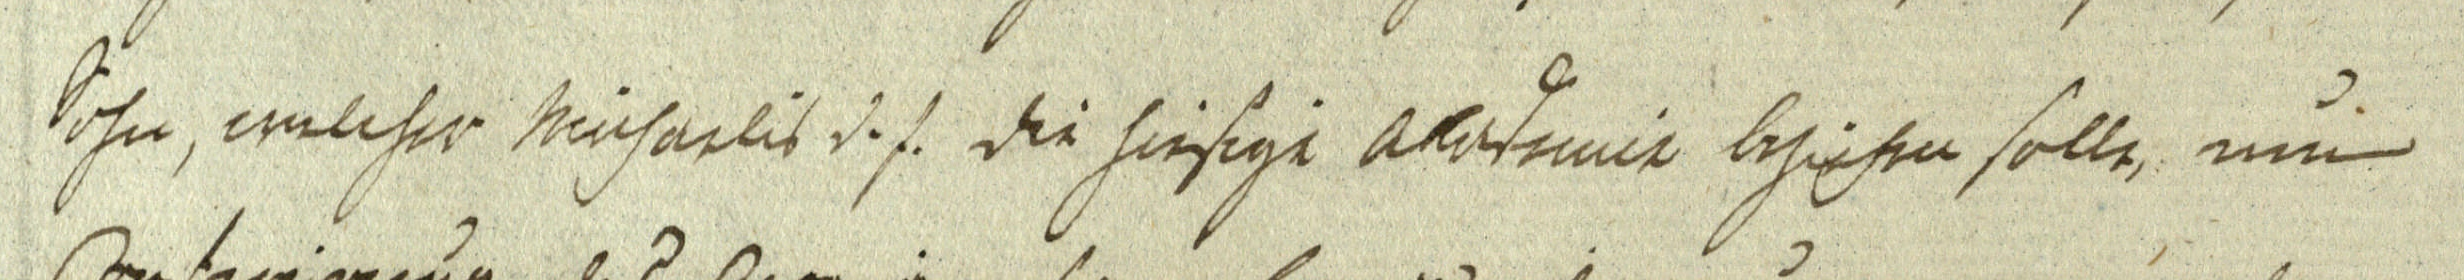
Sohn, welcher Michaelis d. J. die hiesige Akademie beziehen solle, um
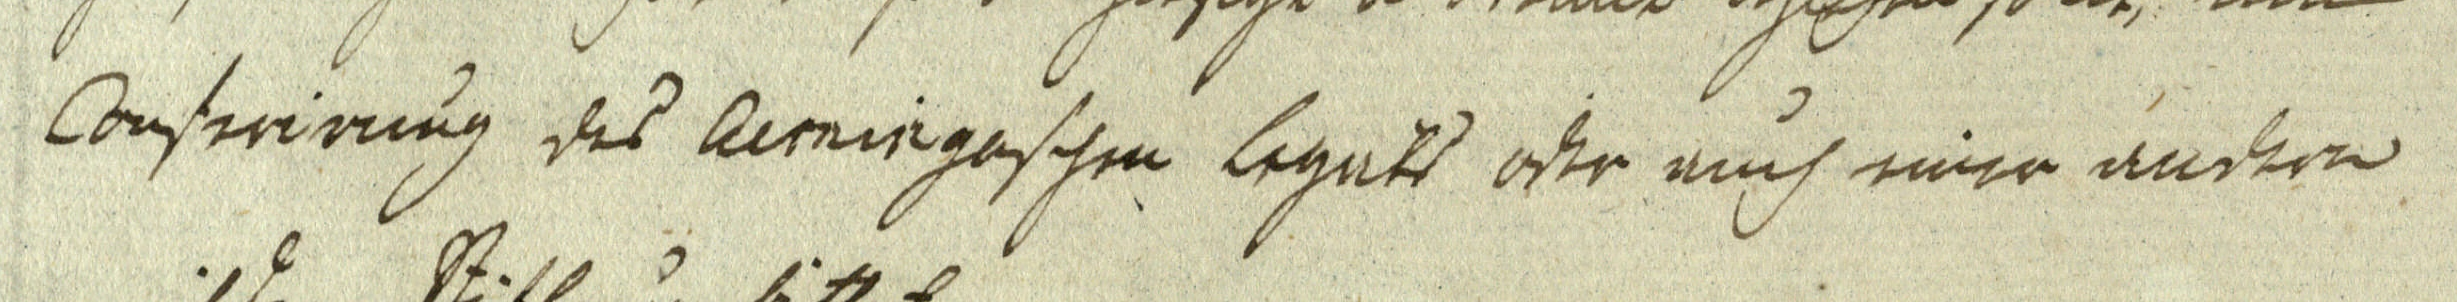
Conferirung des Aemingaschen Legats oder auch einer andern
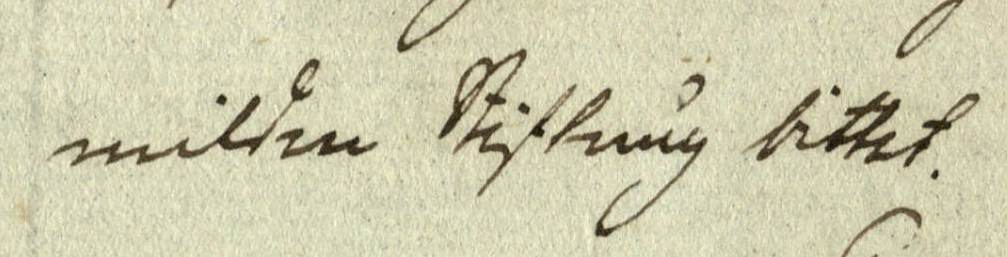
milden Stiftung bittet.
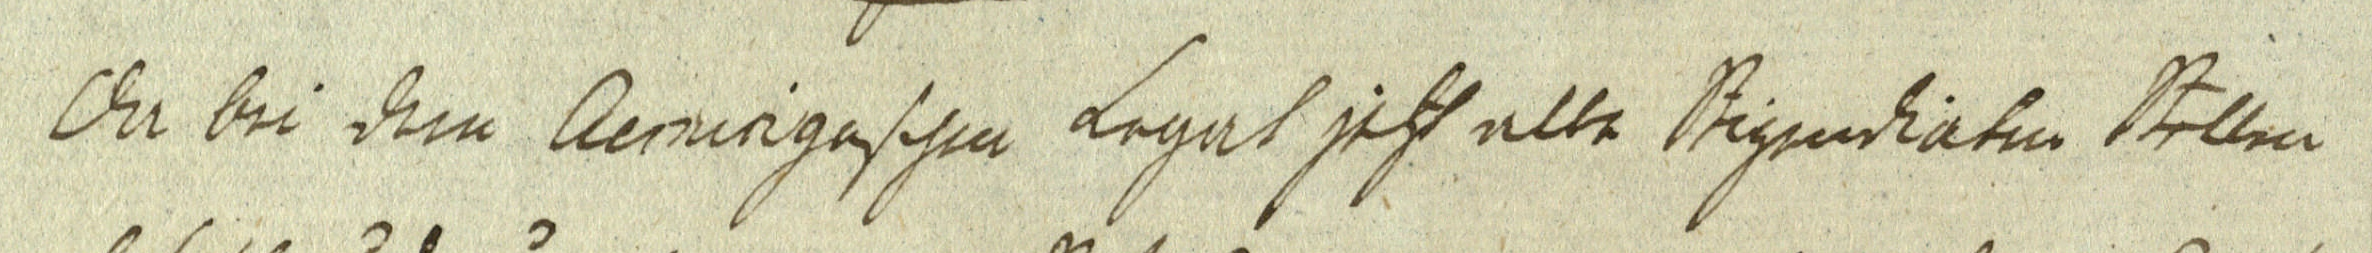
Da bei dem Aemingaschen Legat jetzt alle Stipendiaten Stellen
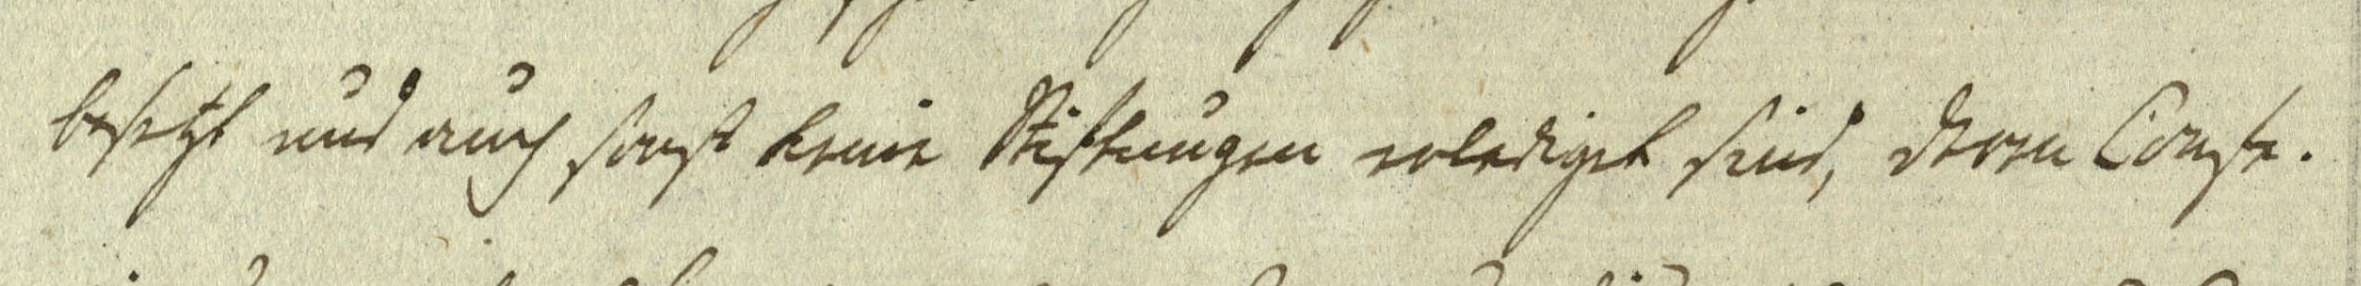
besetzt und auch sonst keine Stiftungen erlediget sind, deren Confe¬
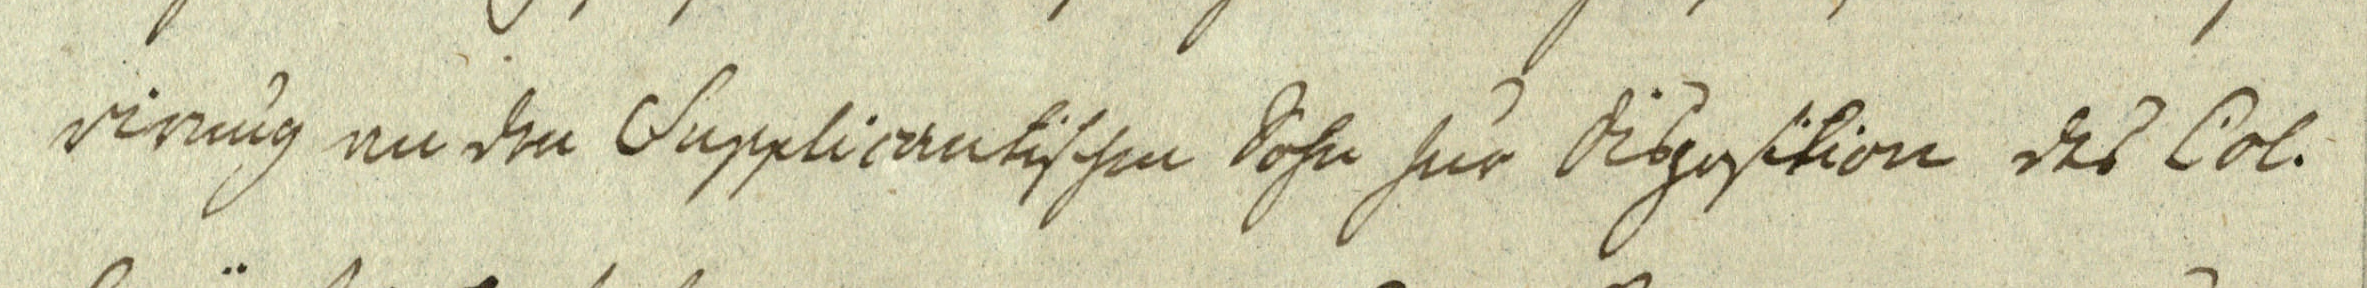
rirung an den Supplicantischen Sohn zur Disposition des Col¬
